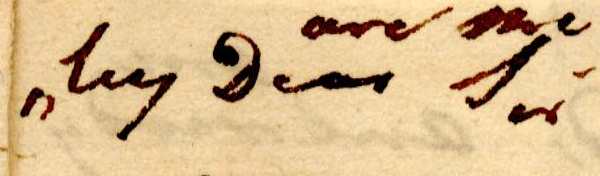My dear Sir
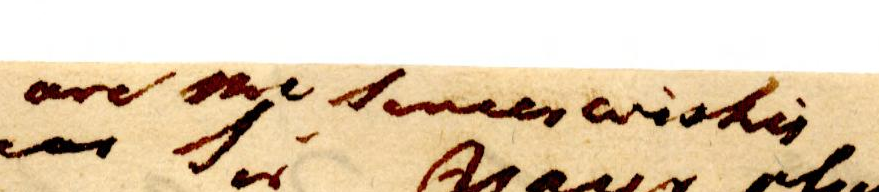are my sincer wishis
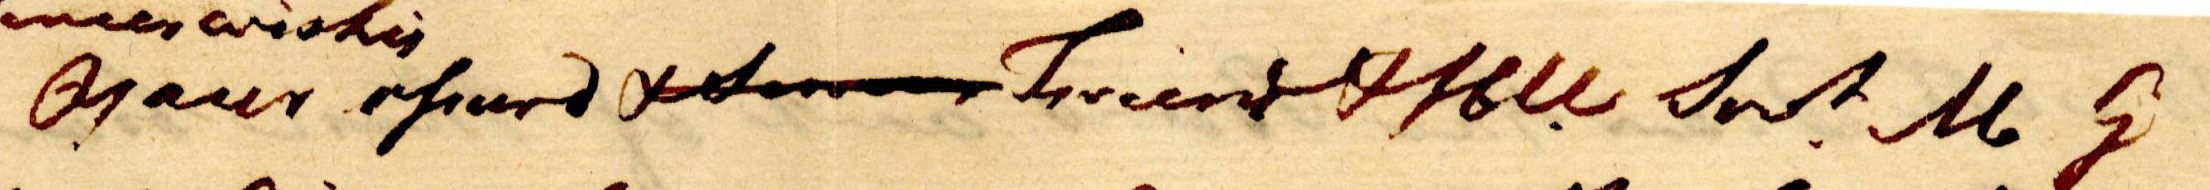your assurd [& s_____] Friend & Hb^le. Serv^t. M G
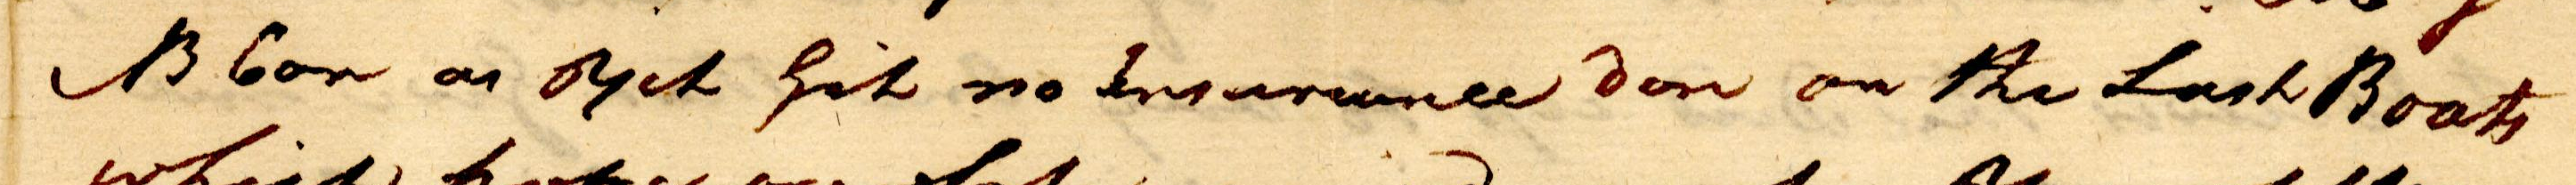B can as yet Git no Insurance don on the Last Boats
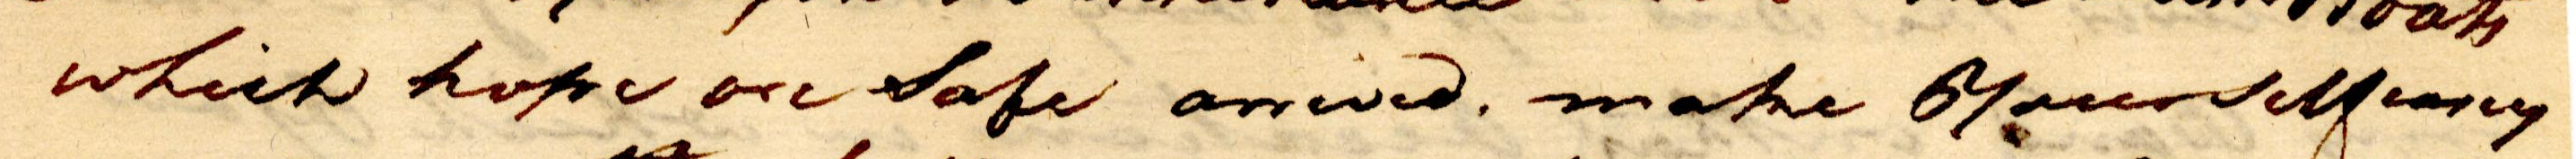which hopes are safe arrived, make yourself carry
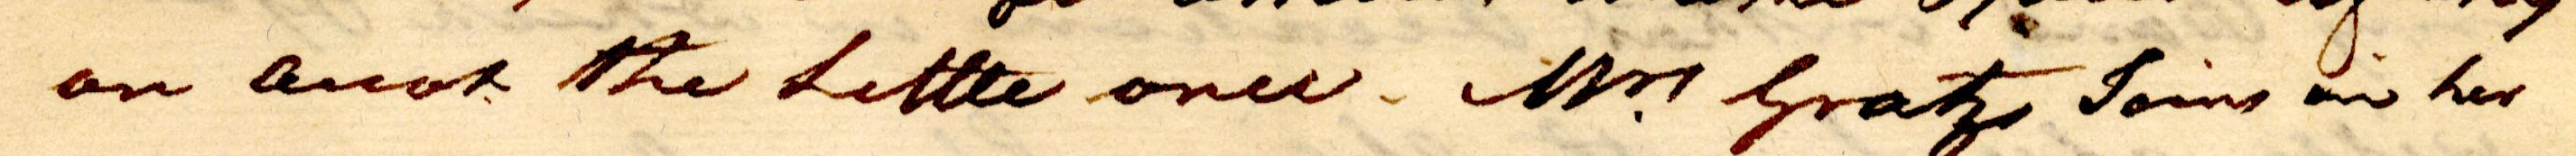an Accot. the Little ones. Mrs Gratz, fair in her
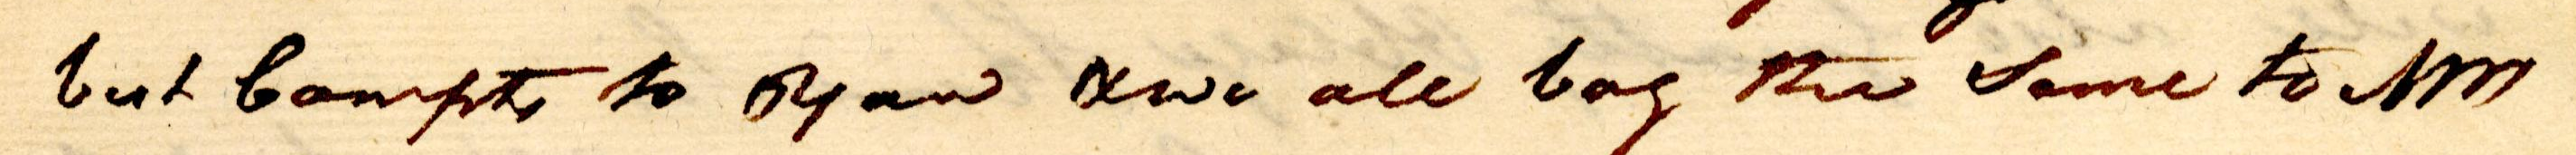but Compts to you & we all beg the same to M^r
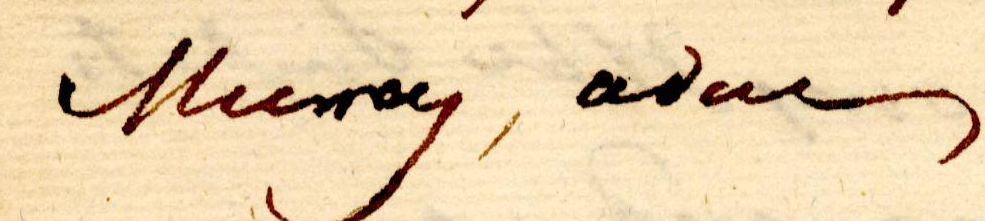Murray, adue
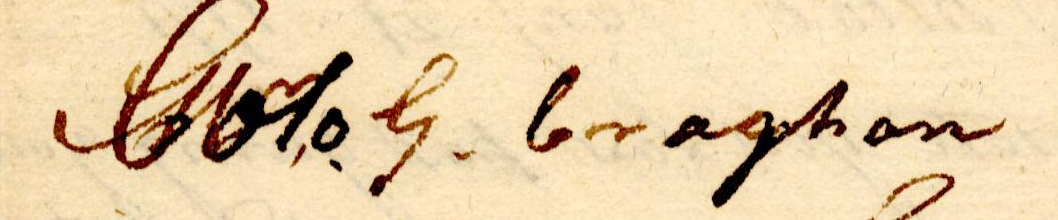[___] G. Croghan
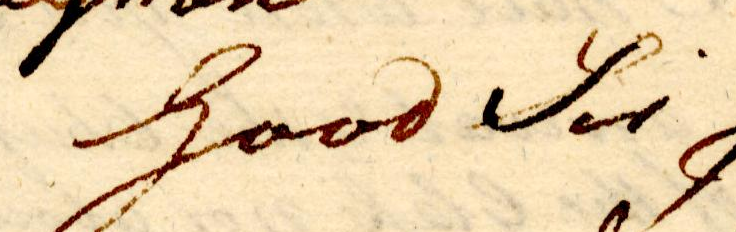Good sir
